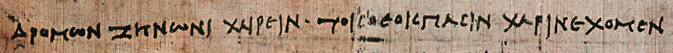δρομων ζηνωνι χαιρειν·τοιϲθεοιϲπαϲιν χαρινεχομεν
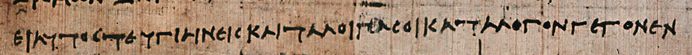ειαυτοϲτευγιαινειϲκαιταλοιπαϲοικαταλογονγεγονεν
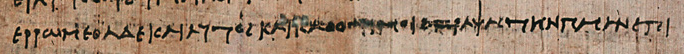ερρωμεθαδεκαιαυτοϲκαικαθοτιμοιεγραψαϲτηνπαϲανεπι
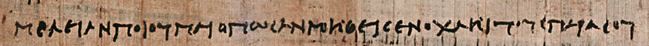μελειανποιουμαιοπωϲανμηθειϲενοχληιτουϲπαραϲου
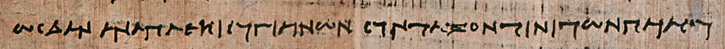ωϲδαναναπλεηιϲυγιαινωνϲυνταξοντινιτωνπαραϲου
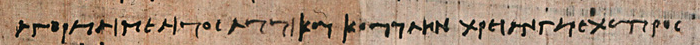αγοραϲαιμελιτοϲαττικουκοτυληνχρειανγαρεχωπροϲ
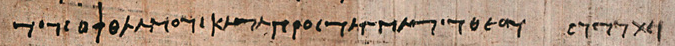τουϲοφθαλμουϲκαταπροϲταγματουθεου ευτυχει
